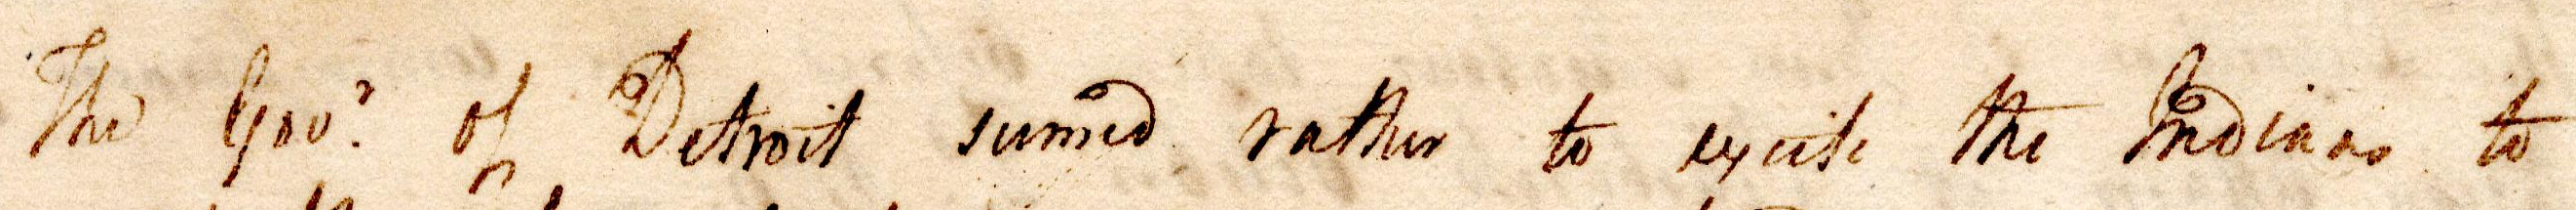The Gov^r. of Detroit seemed rather to excite the Indians to
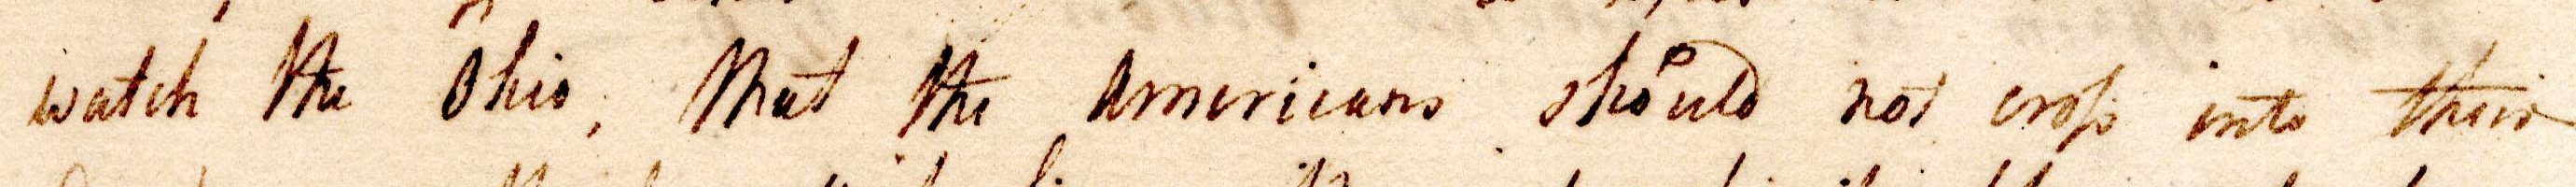watch the Ohio, that the Americans should not cross into their
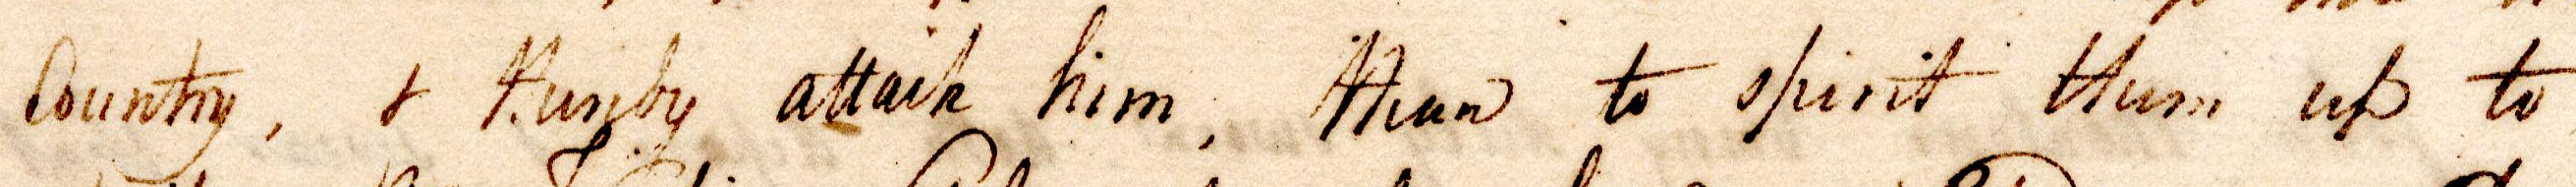Country, & thusly attack him, than to spirit them up to
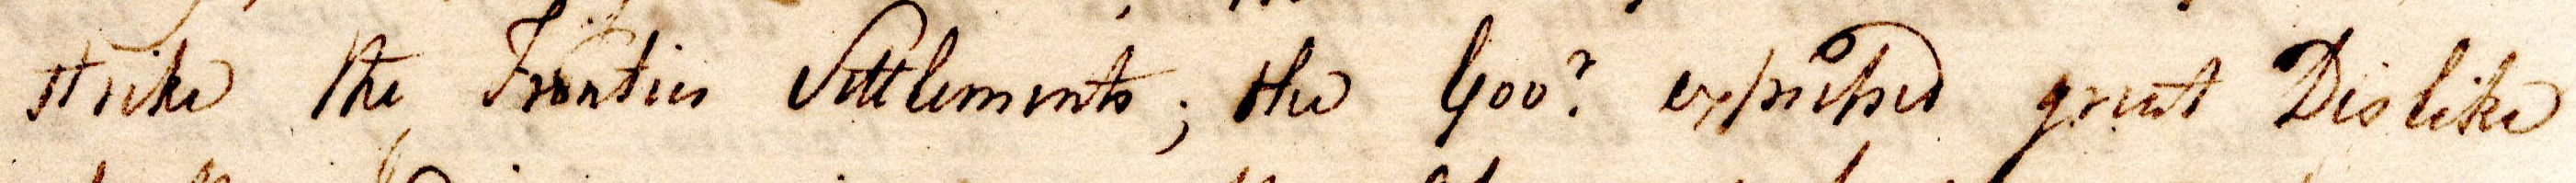strike the Frontier Settlements; the Gov^r. espoused great Dislike
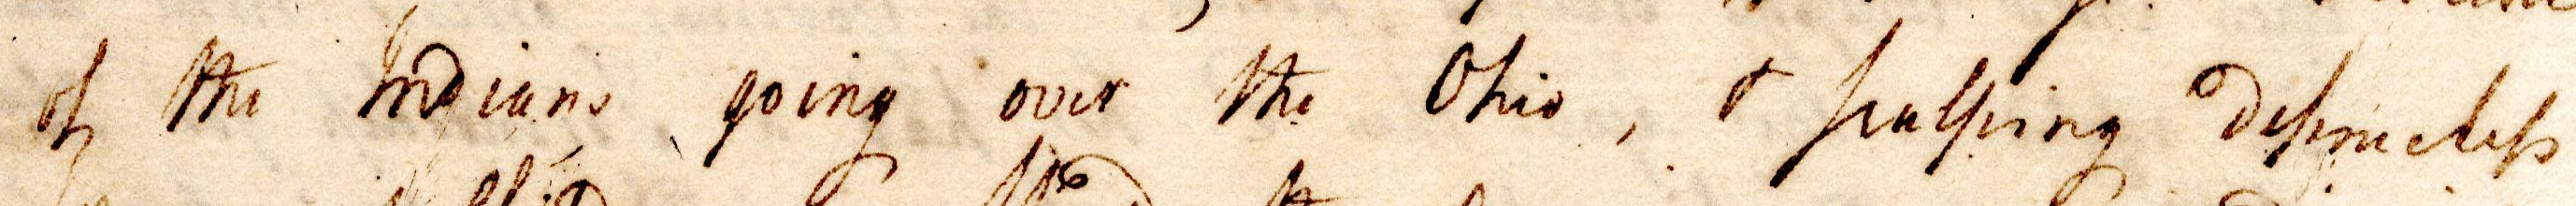of the Indians going over the Ohio, & passing defenceless
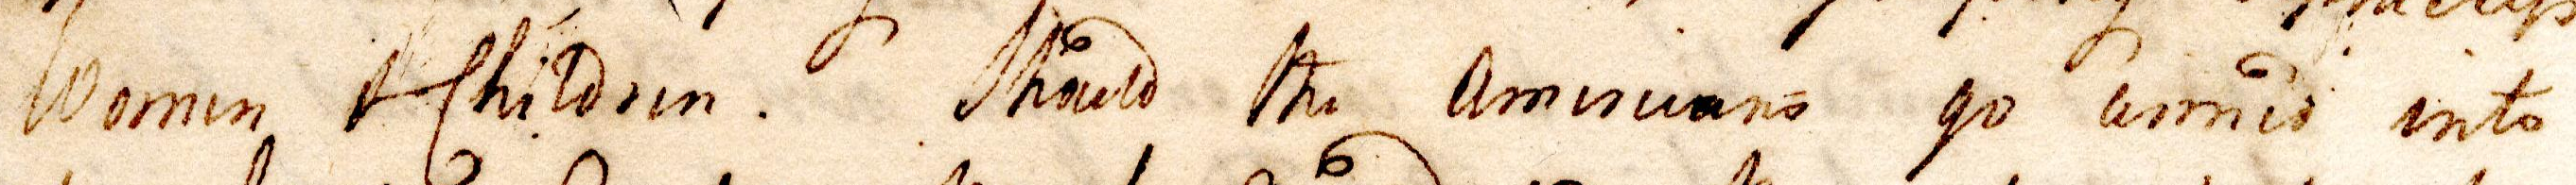Women & Children. Should the Americans go armed into
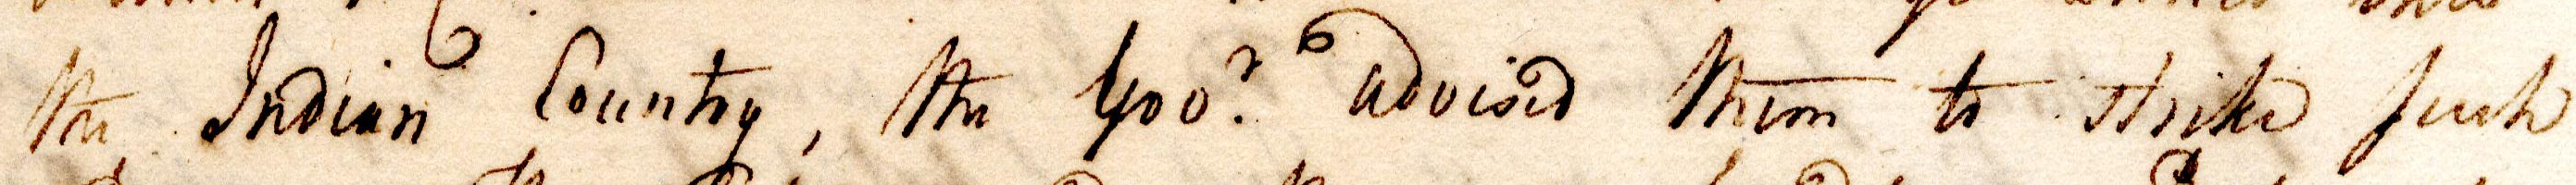the Indian Country, the Gov^r. advised them to strike Such
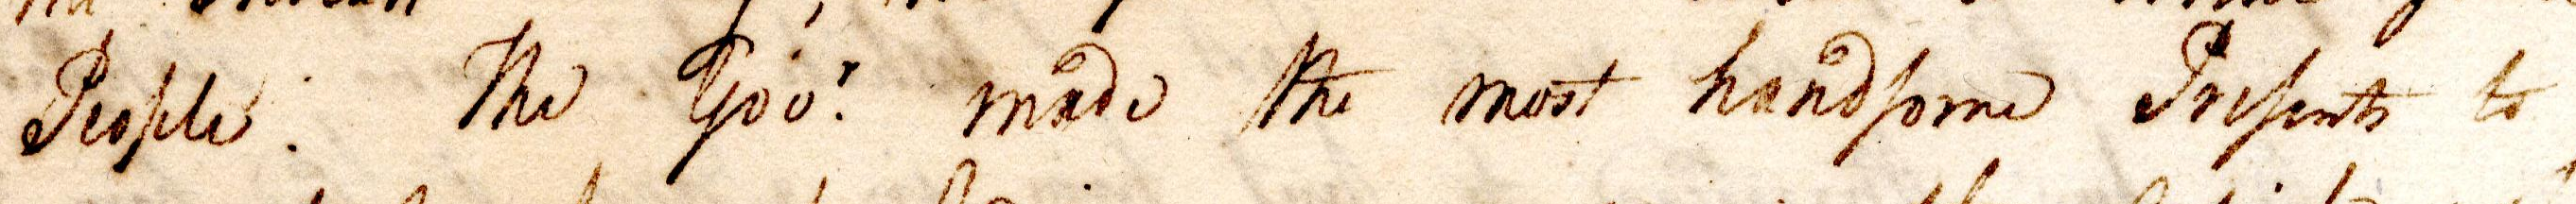People. The Gov^r. made the most handsome Presents to
